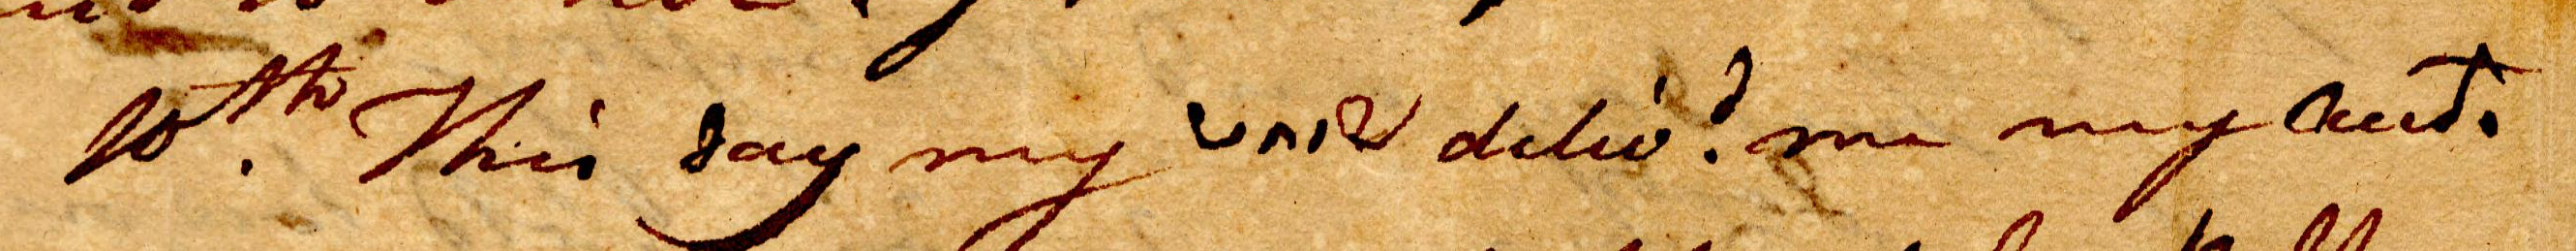10^th. This day my uncle deliv^d. me my acco^t
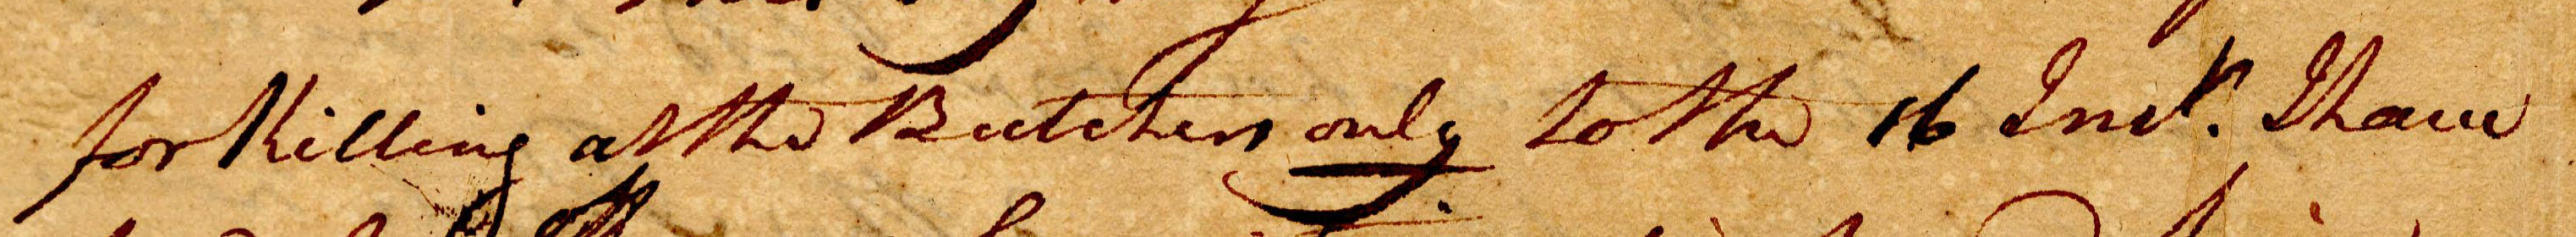for Killing at the Butchers only to the 16 Ins^t. I have
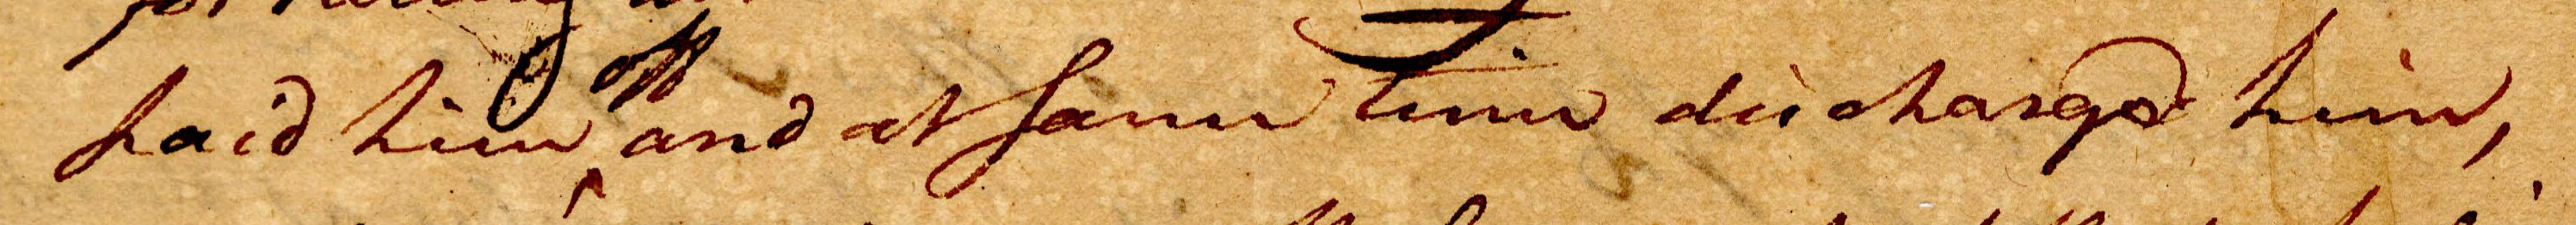paid him ^ and at some time dischargd him,
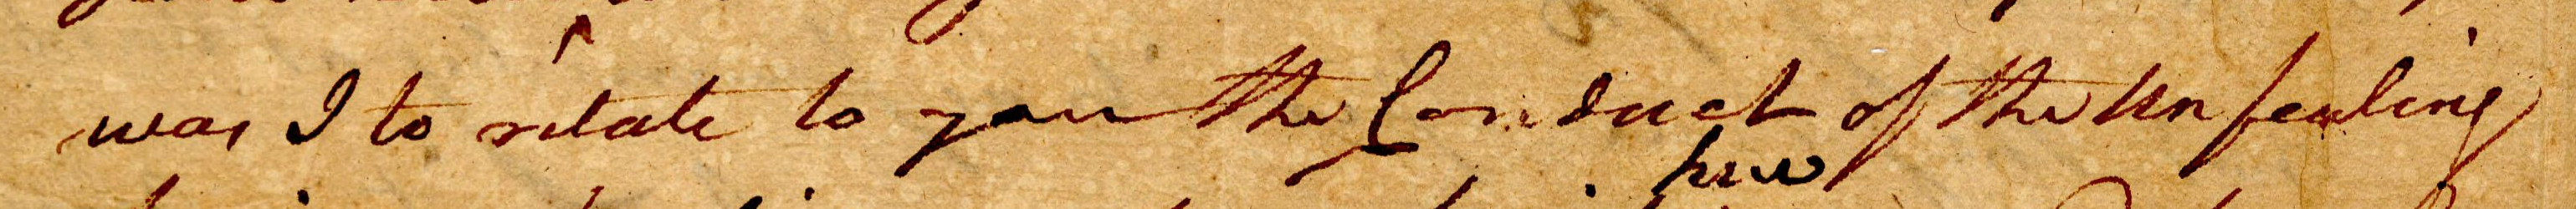was I to relate to you the Conduct of the unlending
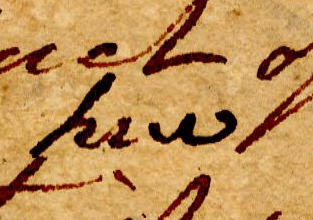have
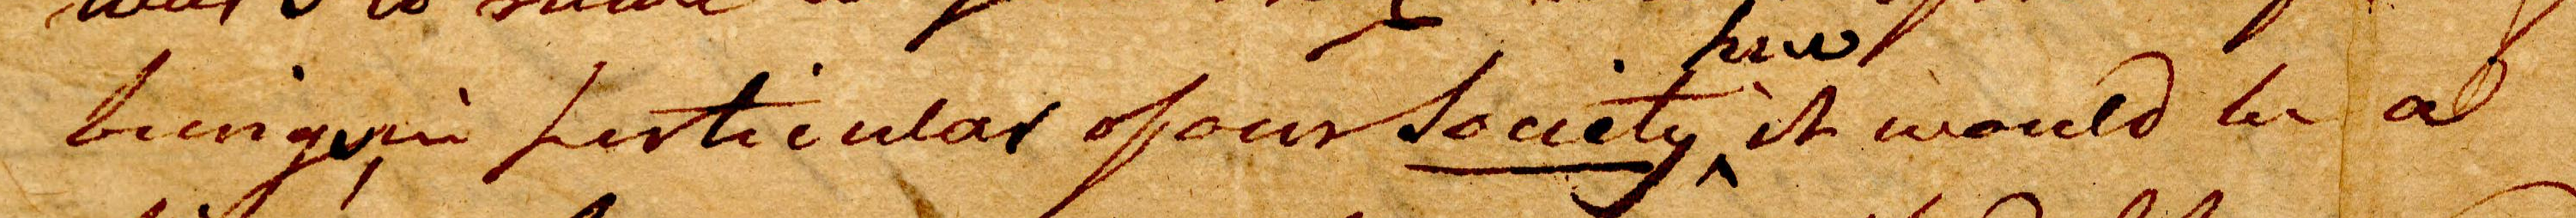been given perticular of our Society ^ it would be a
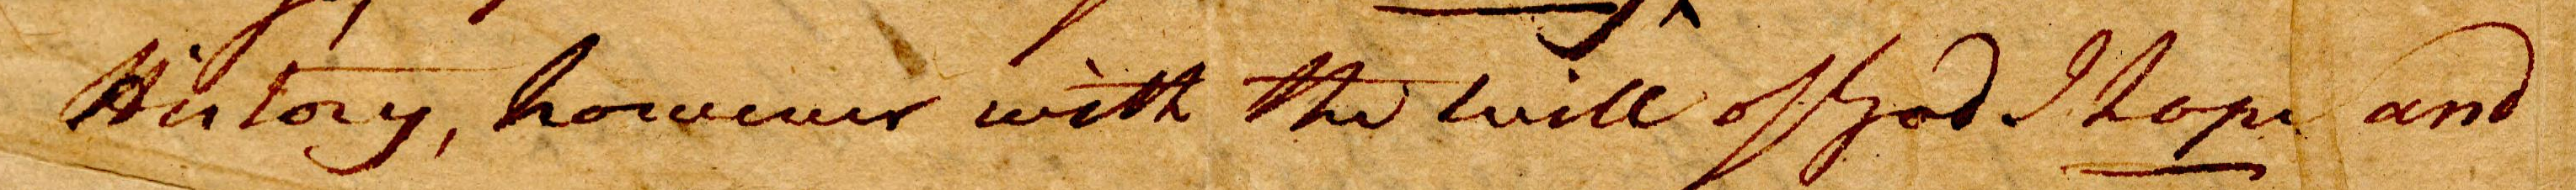history, however with the will offerd I hope and
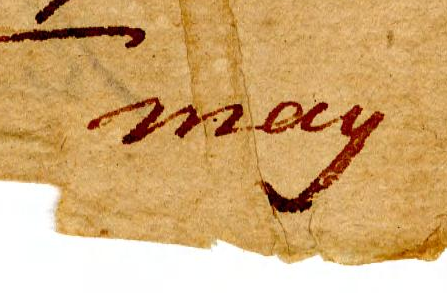may
